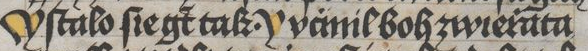Yſtalo ſie ḡt tak. Y vċinil boh zwieṙata
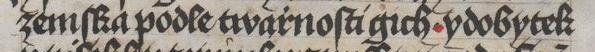zemſka podle twaṙnoſtí gich. ydobytek
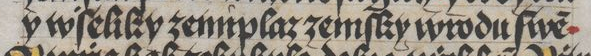y wẛeliky zemiplaz zemſky wrodu ſwē.
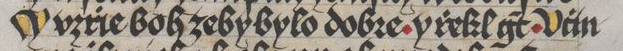Y vzṙie boh zeby bylo dobre.y ṙekl ḡt.Vċín¬
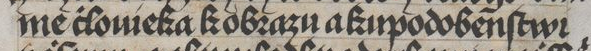me ċlouíeka k obrazu akupodobenſtwí
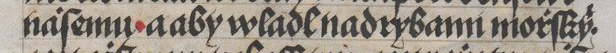naẛemu.a aby wladl nadrybamí moṙſkȳ.
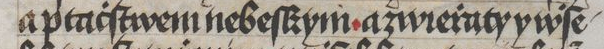a ptaċſtwem nebeſkym.a zwieṙaty y wẛe¬
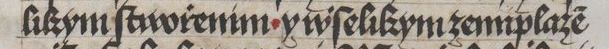likym ſtwoṙením. y wẛelikym zemiplazē
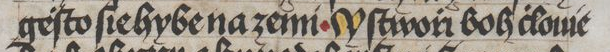geẛto ſie hybe na zemí. Y ſtwoṙi boh ċlouíe¬
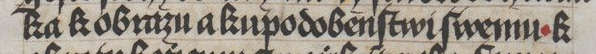ka k obrazu a kupodobenſtwí ſwemu.k
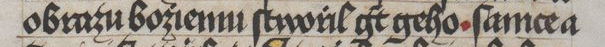obrazu bożiemu ſtwoṙil ḡt geho. ſamce a
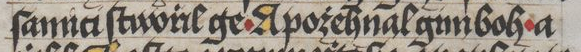samicí ſtwoṙil ge. A pożehnal gím boh. a
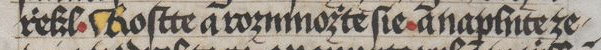ṙekl.Roſtte a rozmnożte ſie.a naplnte ze¬
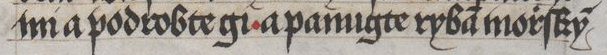mí a podrobte gi.a panugte rybā moṙſkȳ
